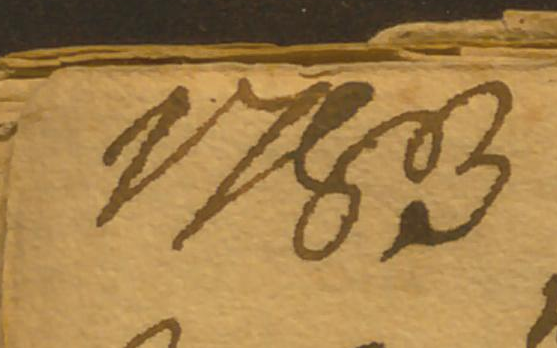1783
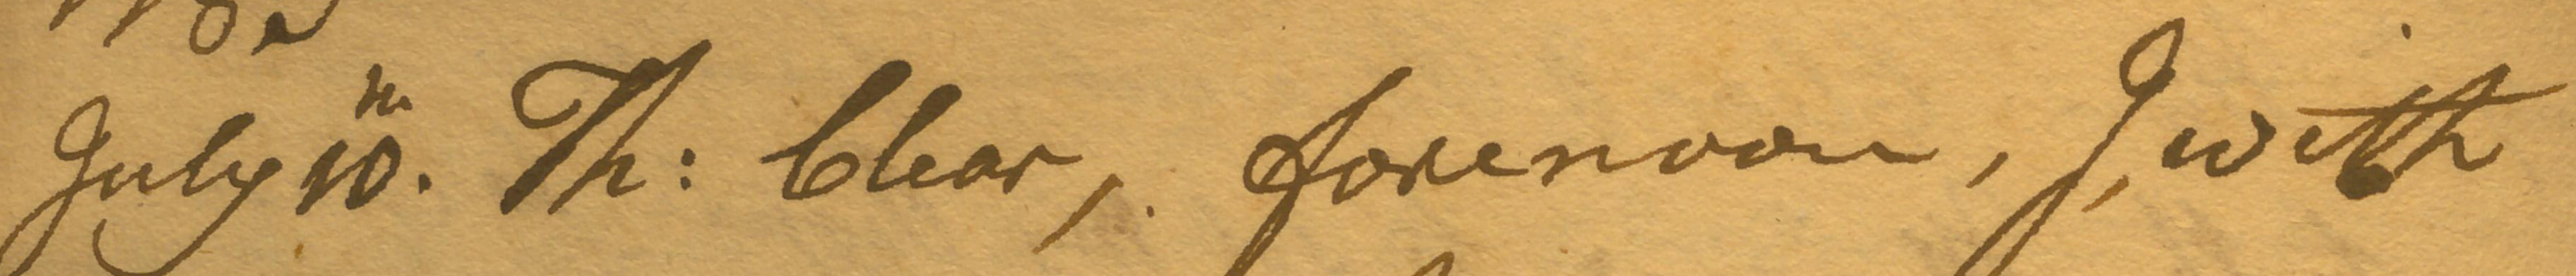July 10th. Th: Clear. forenoon, I with
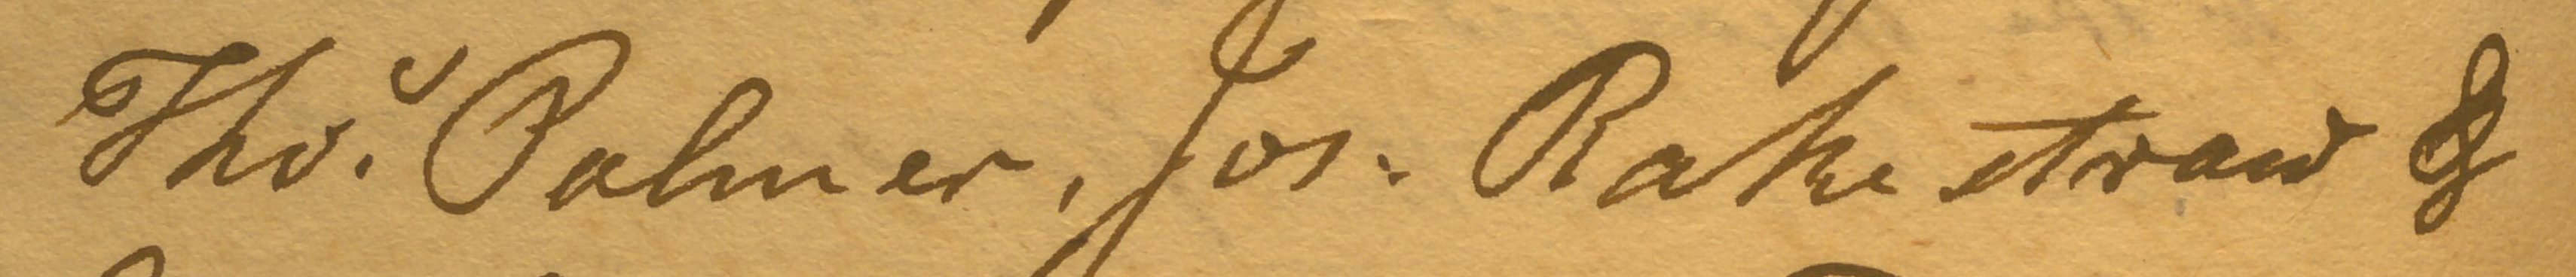Tho^s. Palmer, Jos: Rake straw &
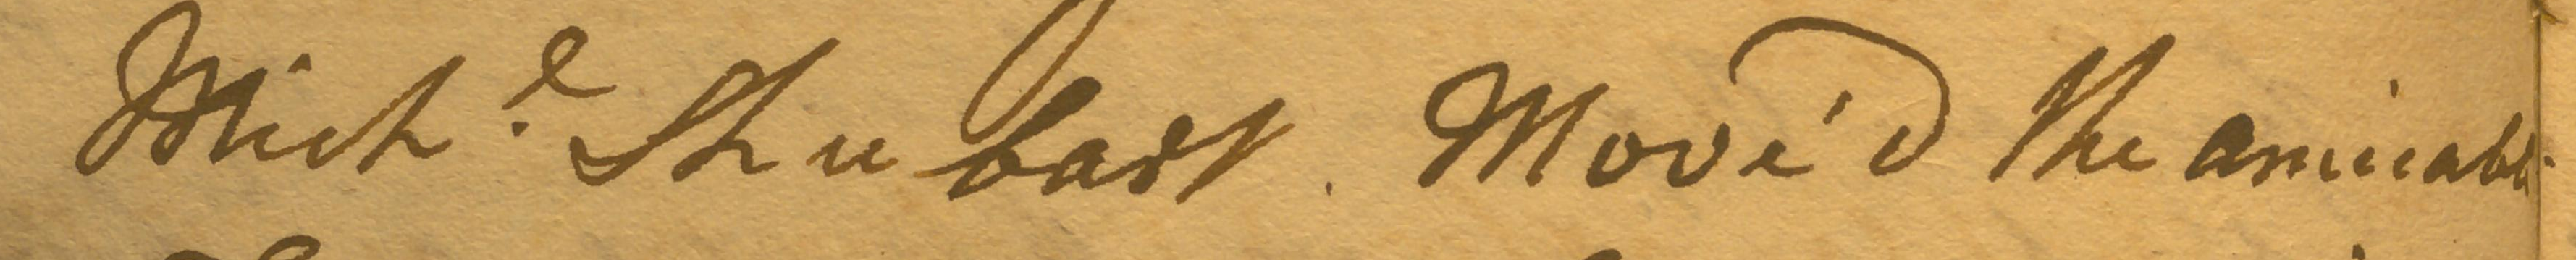Mich^l. Shubar. Move'd the amicable
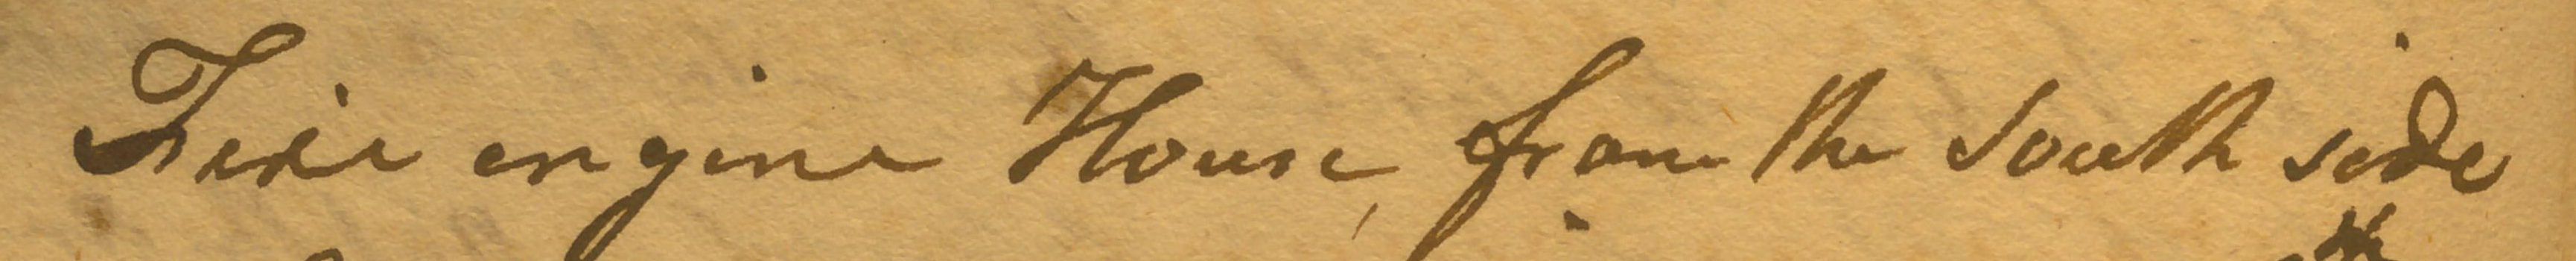Fixe engine House from the South side
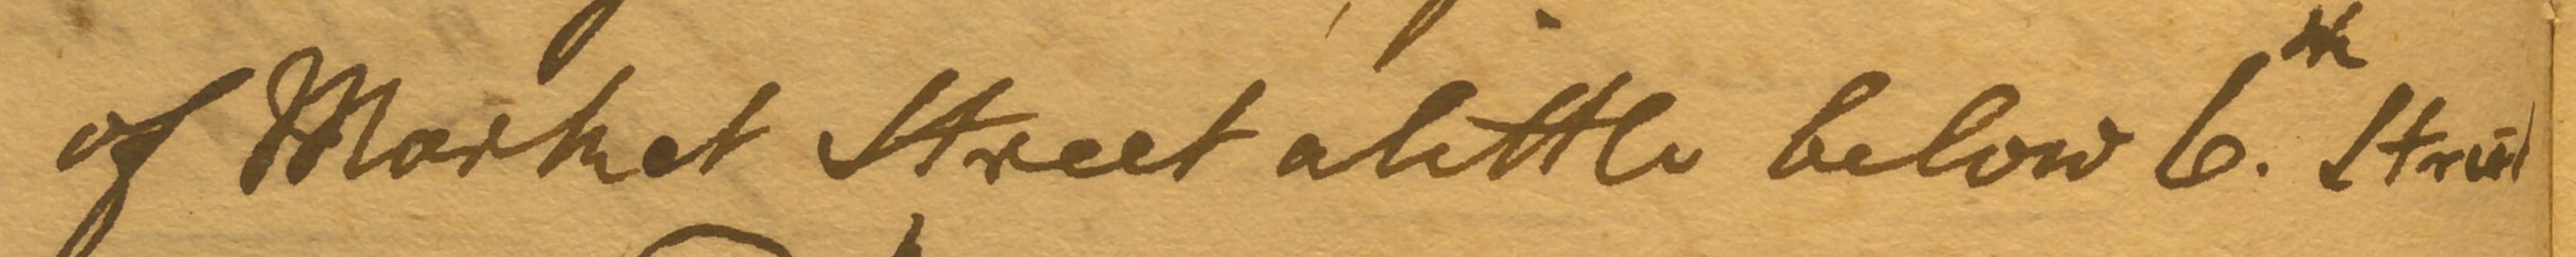of Market Street a little below 6^th. Street
